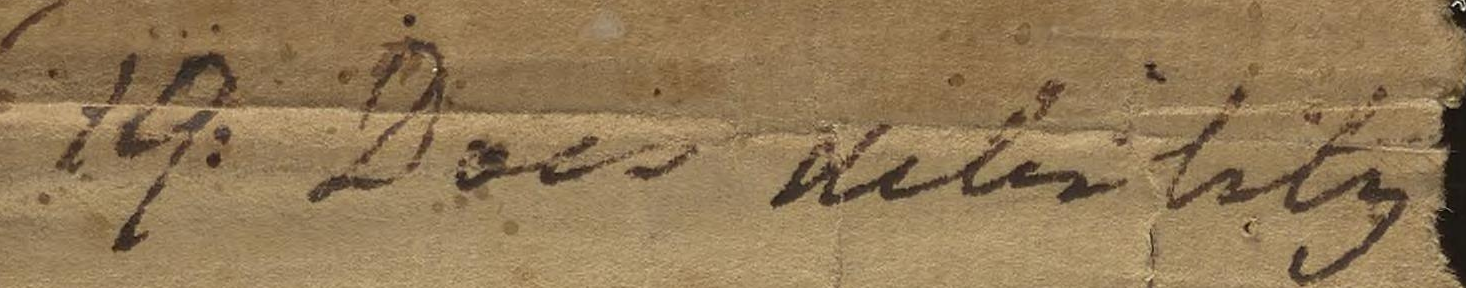19 Does debility
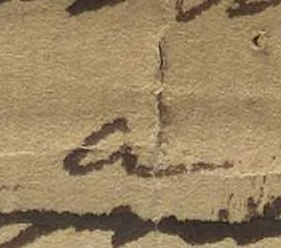a
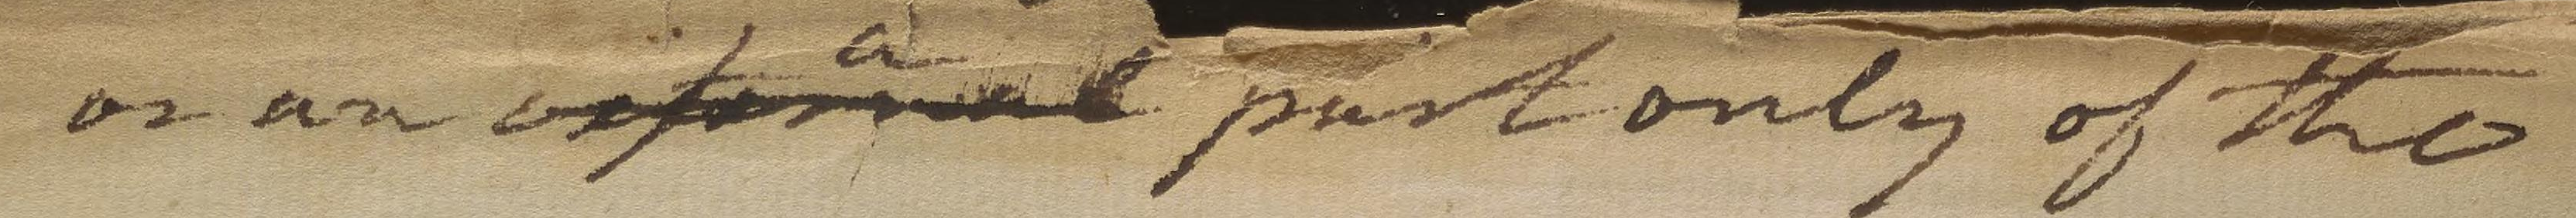or an [external] part only of the
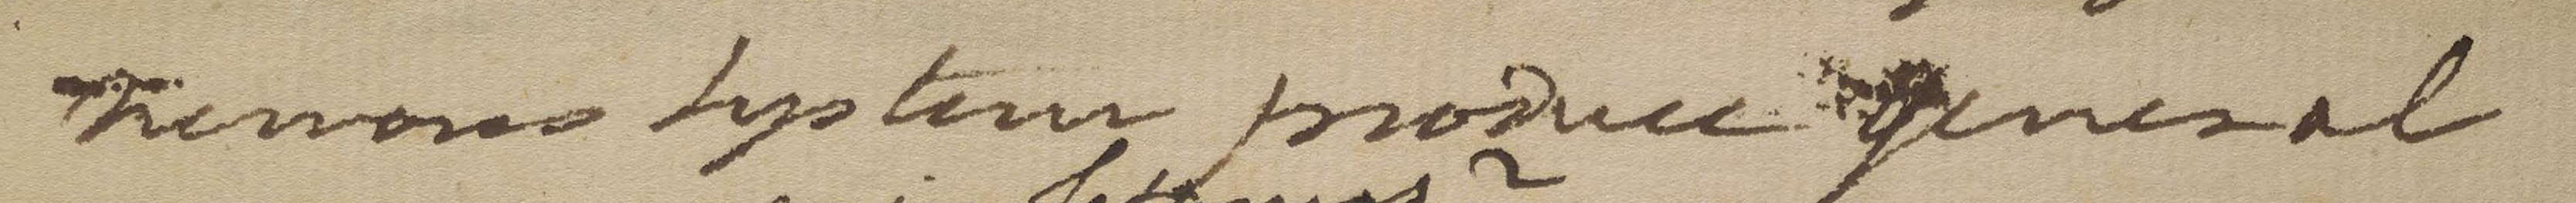nervous sytem produce general
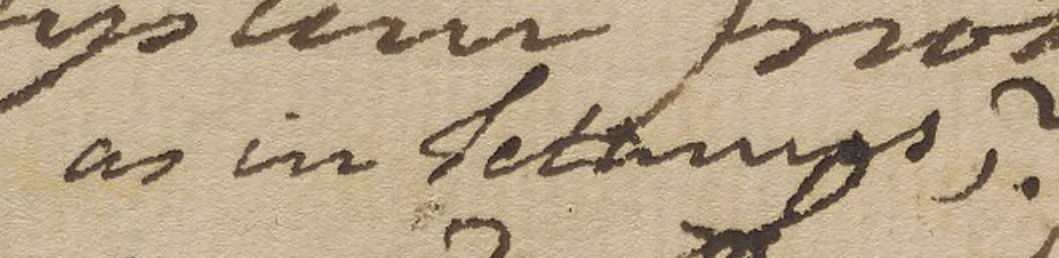as in settings,
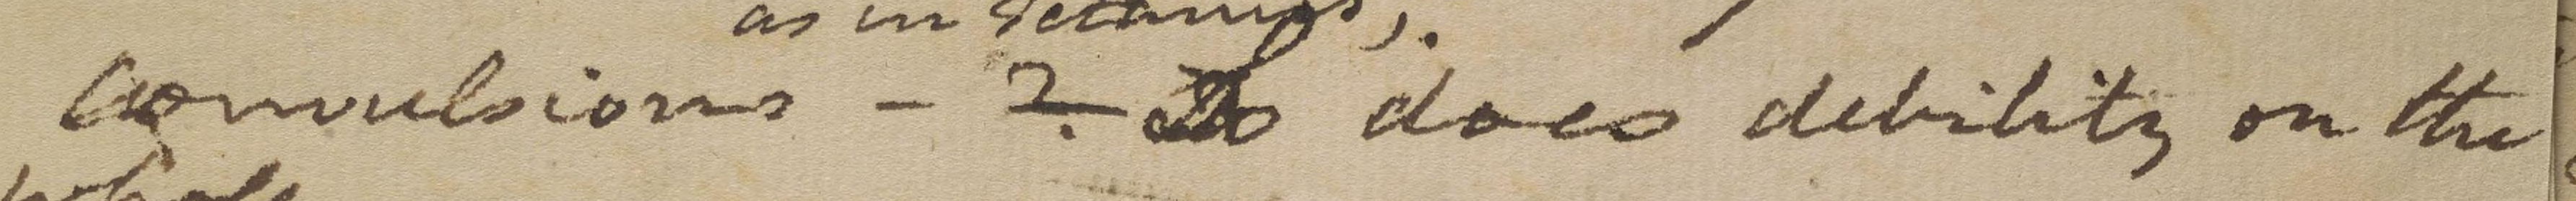convulsions? So does debility on the
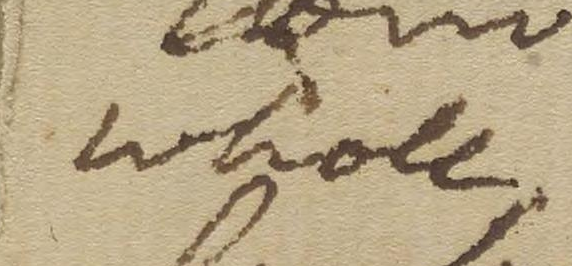whole
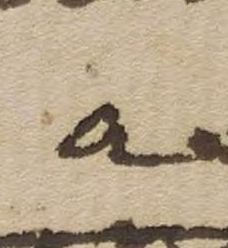a
